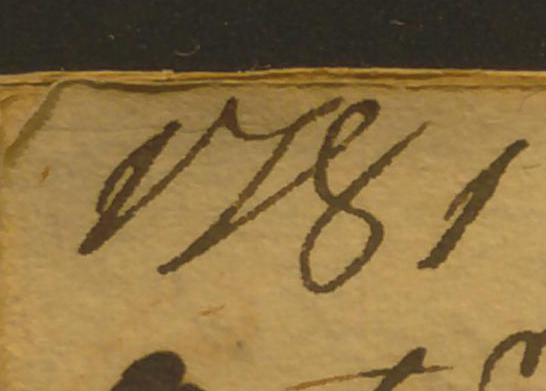1781
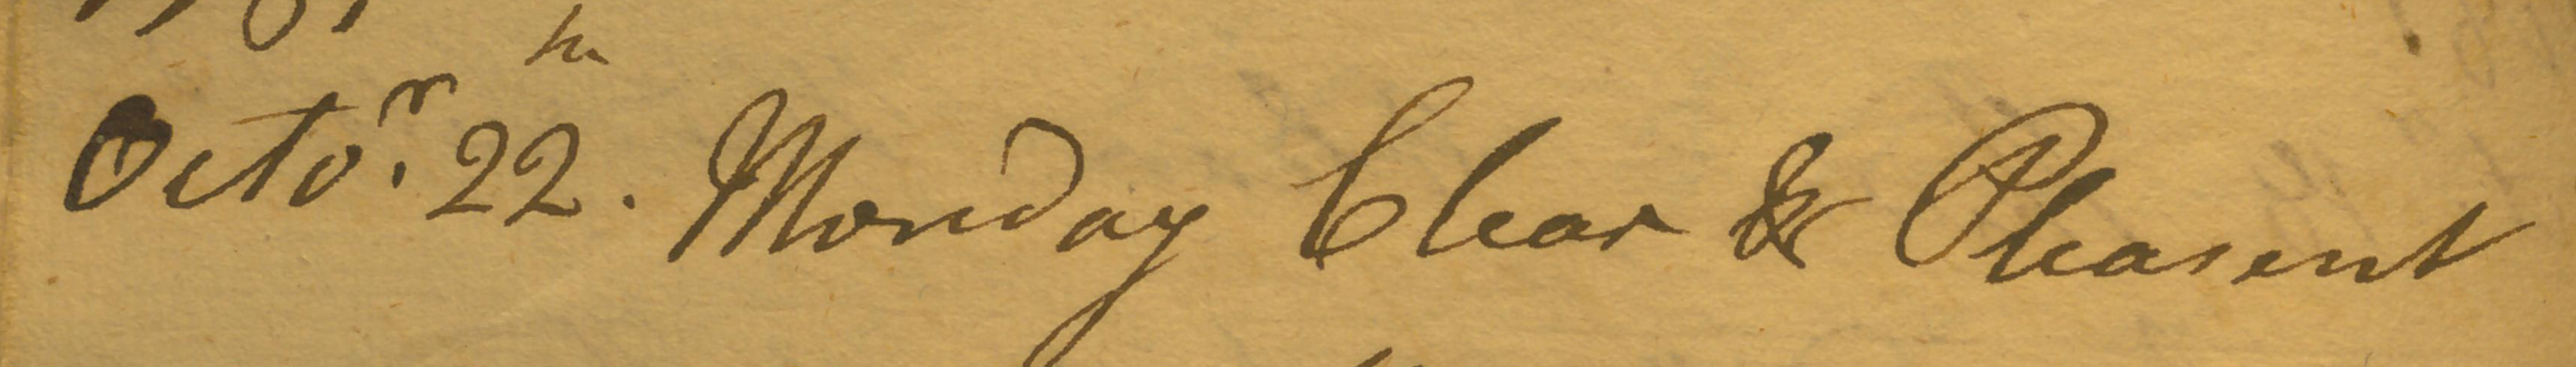Octo^r. 22^th. Monday Clear & Pleasent
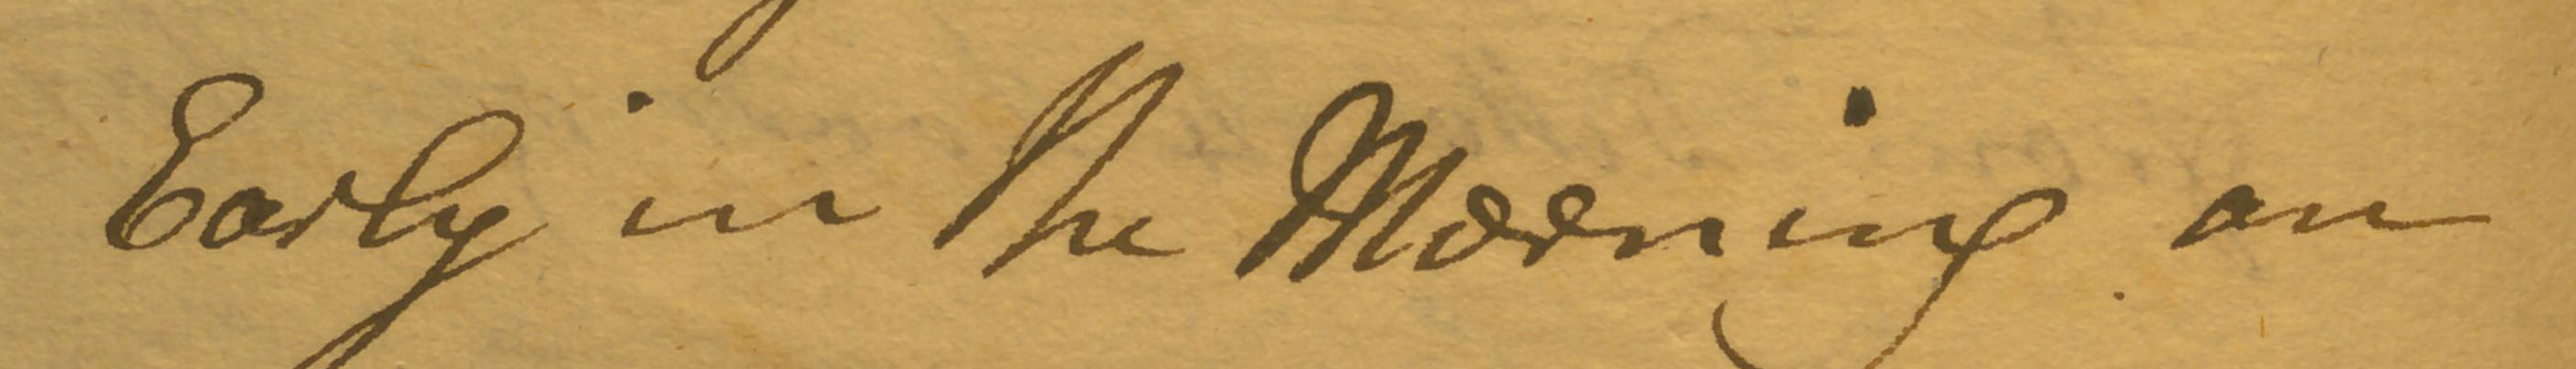Early in the Morning an
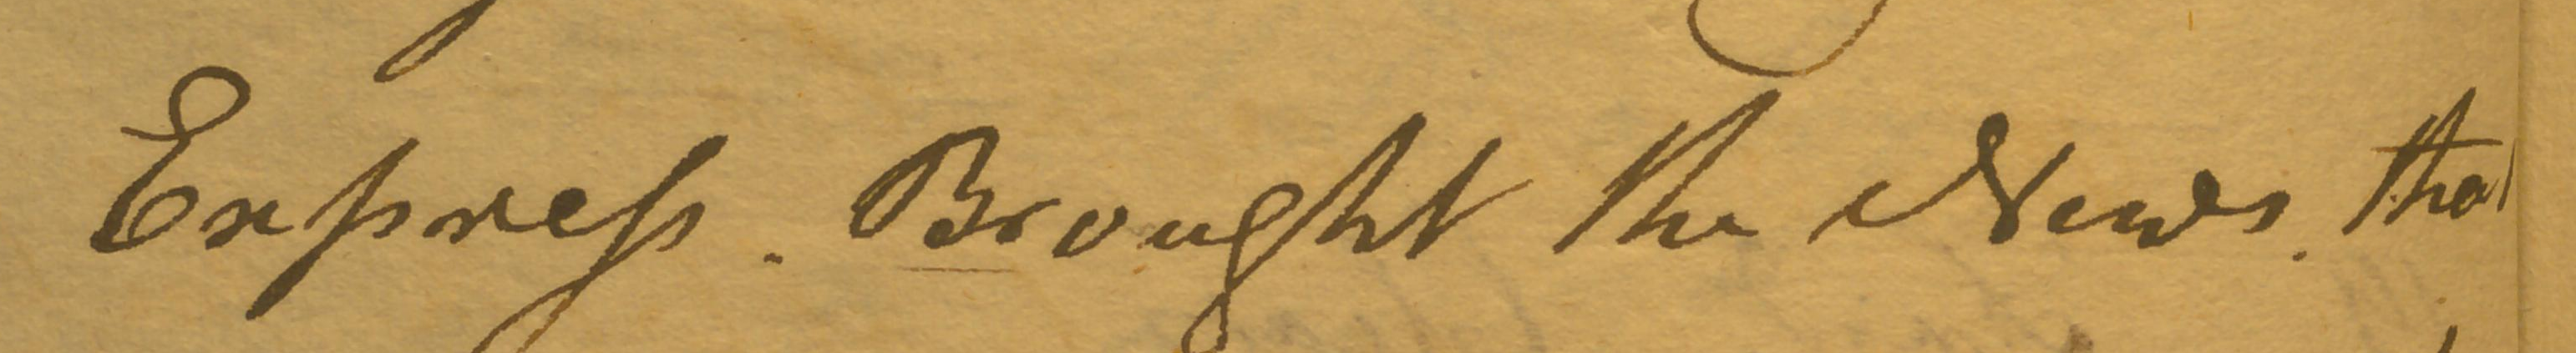Express, Brought the News that
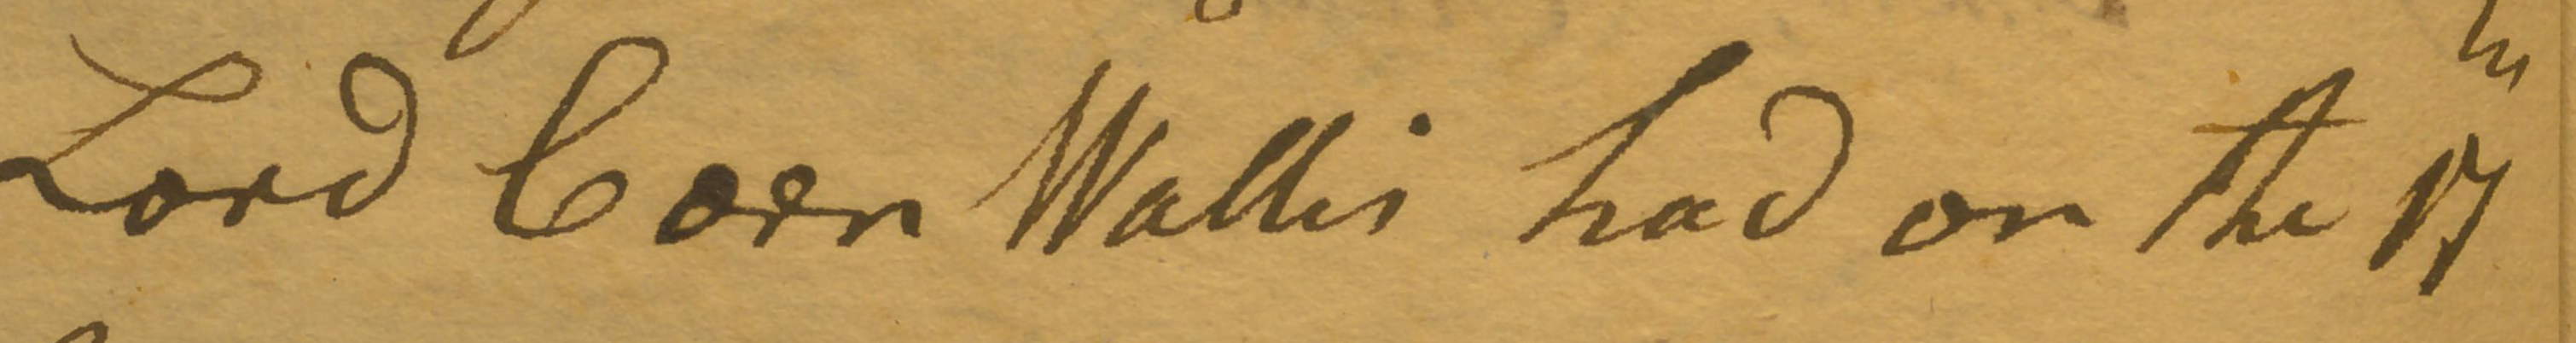Lord Corn Wallis had on the 17^th
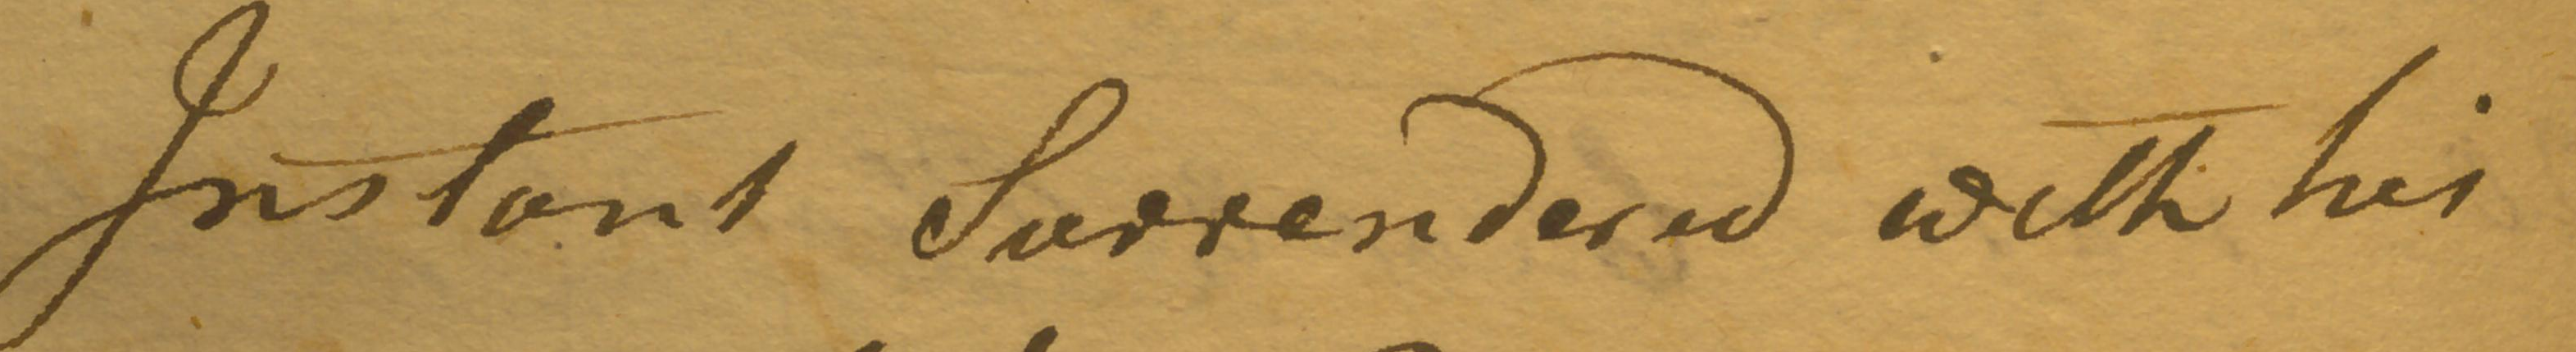Instant surrendered with his
